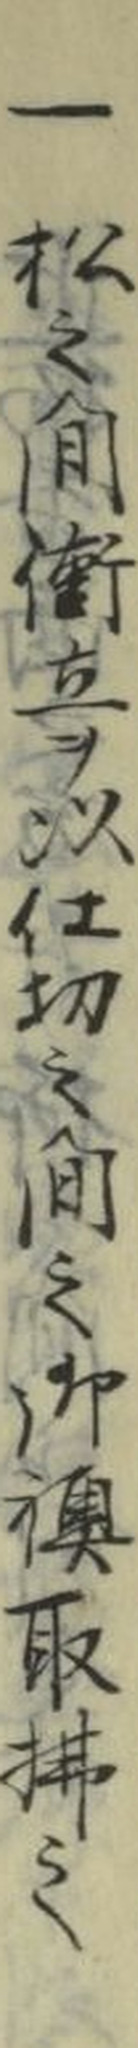一松之間衝立を以仕切之間之御襖取払之
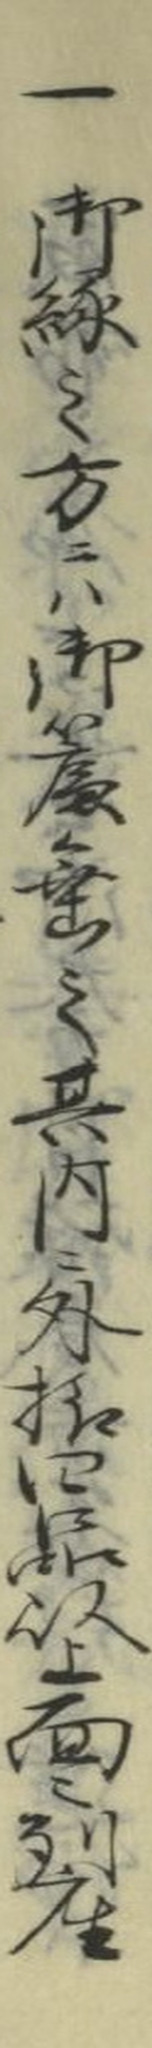一御縁之方には御簾垂之其内に外様四品以上面々列座
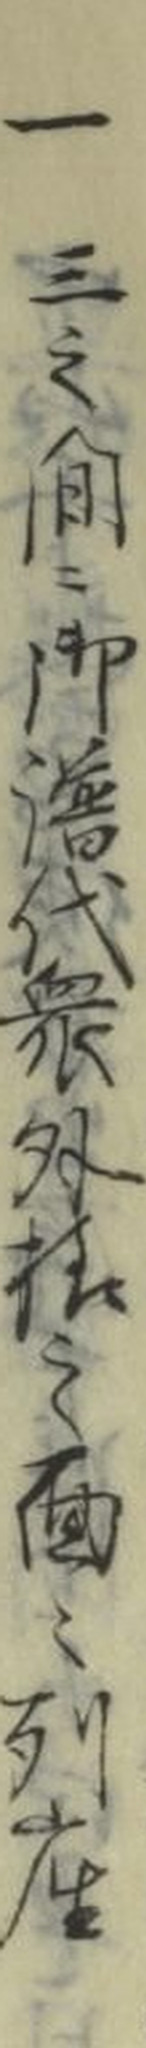一三之間に御譜代衆外様之面々列座
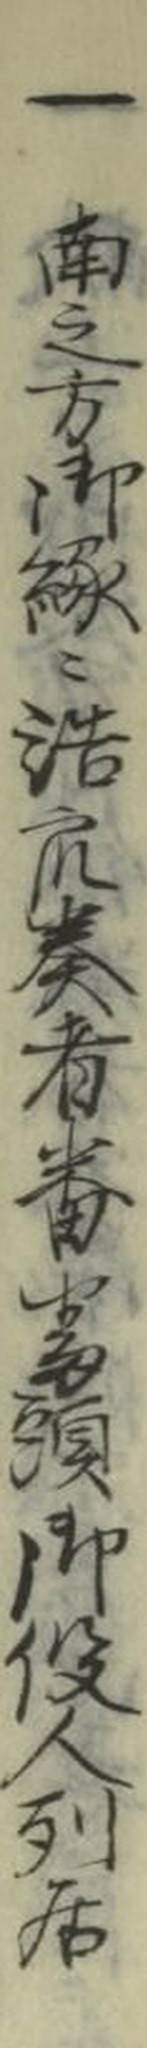一南之方御縁々詰衆奏者番番頭御役人列居
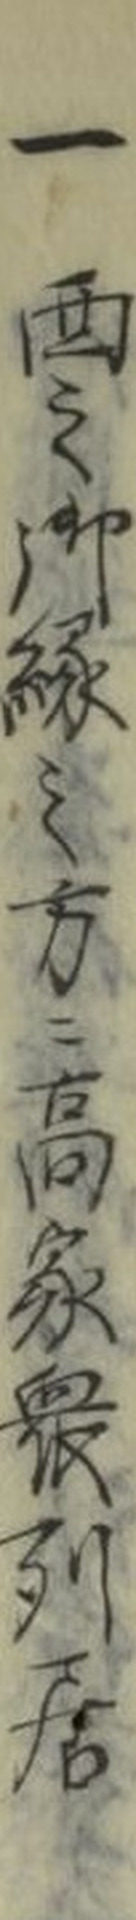一西之御縁之方に高家衆列居
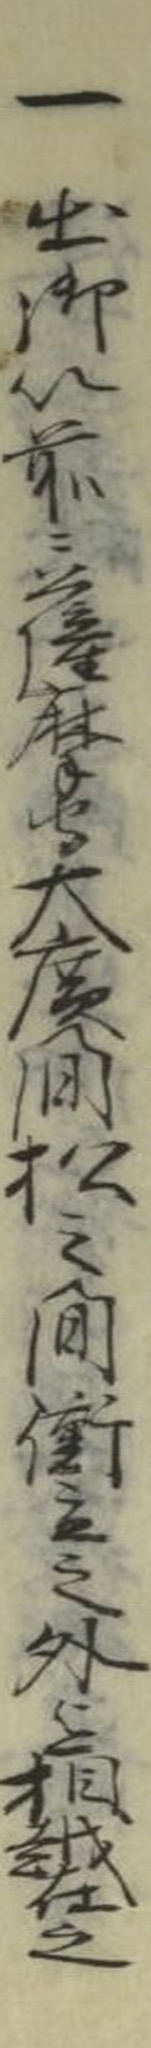一出御以前に薩摩守大広間松之間衝立之外迄相越仕之
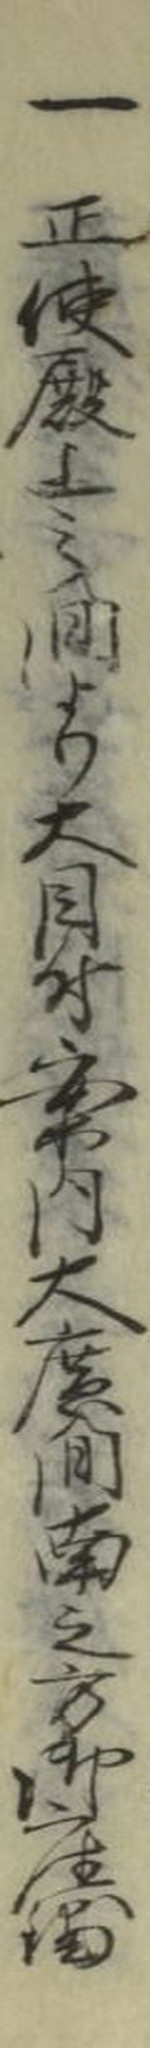一正使殿上之間より大目付案内大広間南之方御座鋪
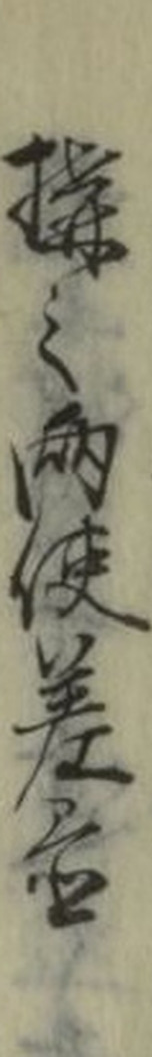構之両使差置
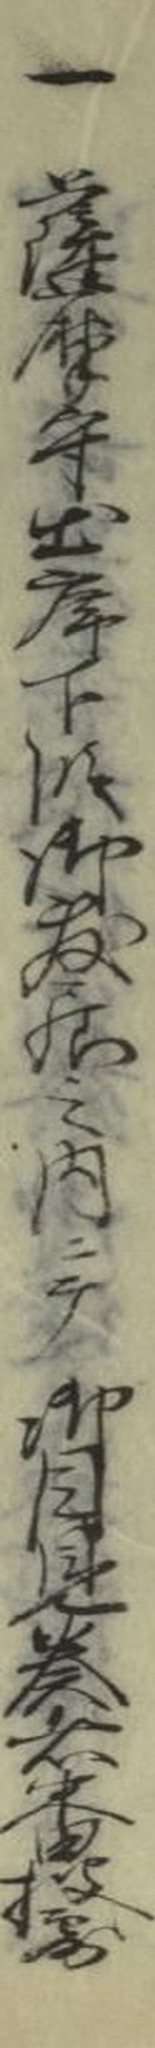一薩摩守出席下段御敷居之内にて御目見奏者番披露
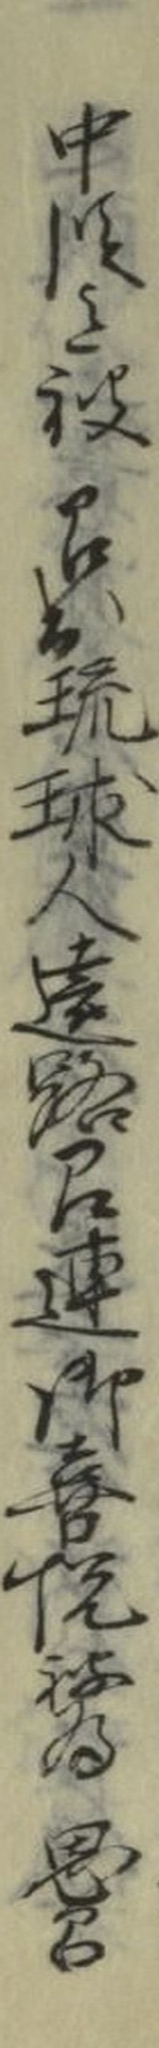中段迄被召出琉球人遠路召連御喜悦被為思召

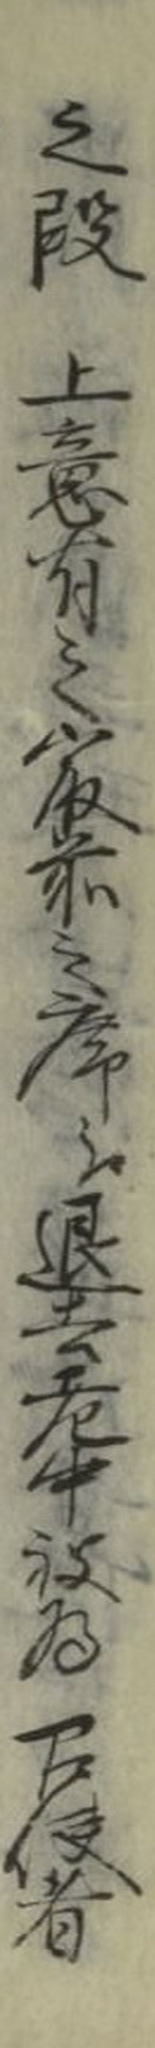之段上意有之最前之席え退去老中被為召使者
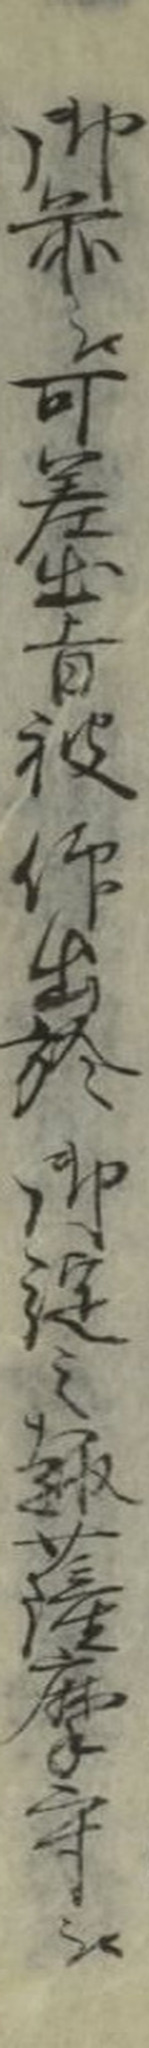御前え可差出旨被仰出於御諚之趣薩摩守え
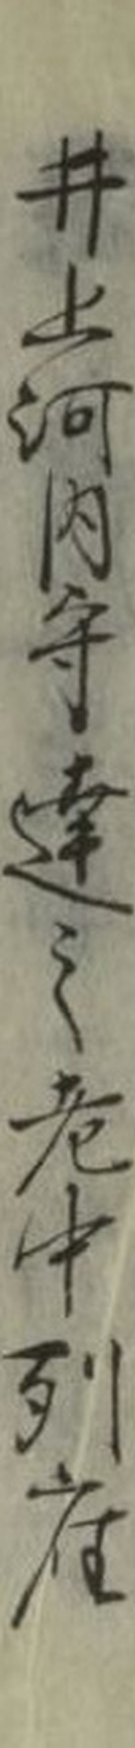井上河内守達之老中列座
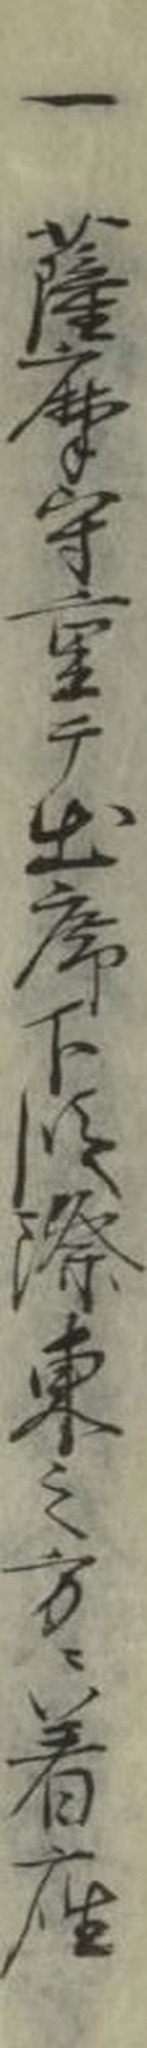一薩摩守重て出席下段際東之方に着座
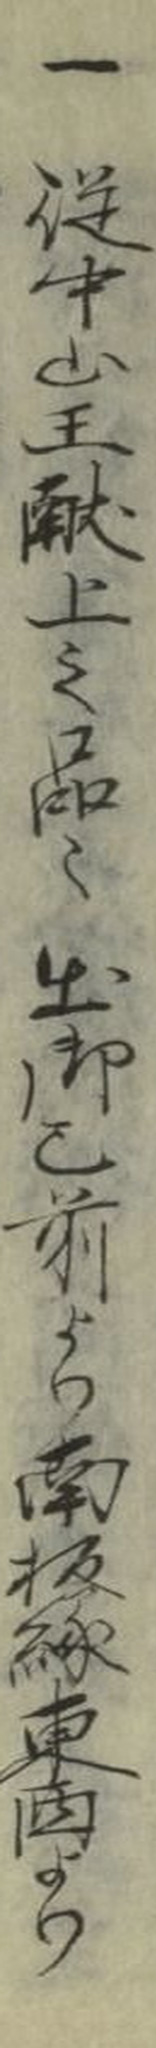一従中山王献上之品々出御已前より南縁東西より
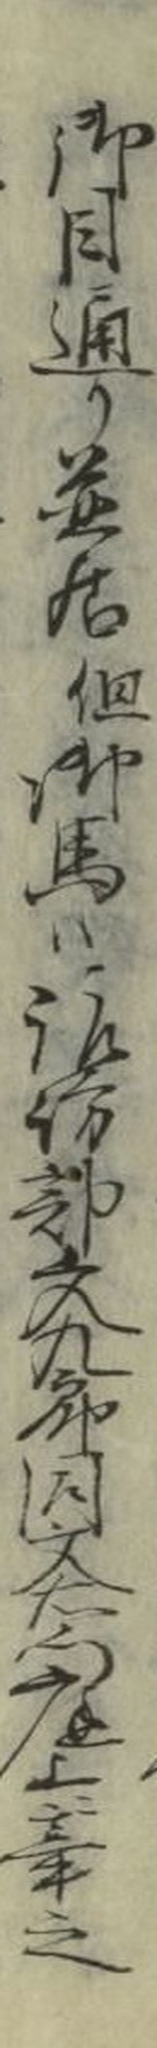御目通り並居但御馬は諏訪部文九郎同文右衛門庭上に牽之
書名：宝永七庚寅年琉球国来聘使日記
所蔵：University of the Ryukyus Library
